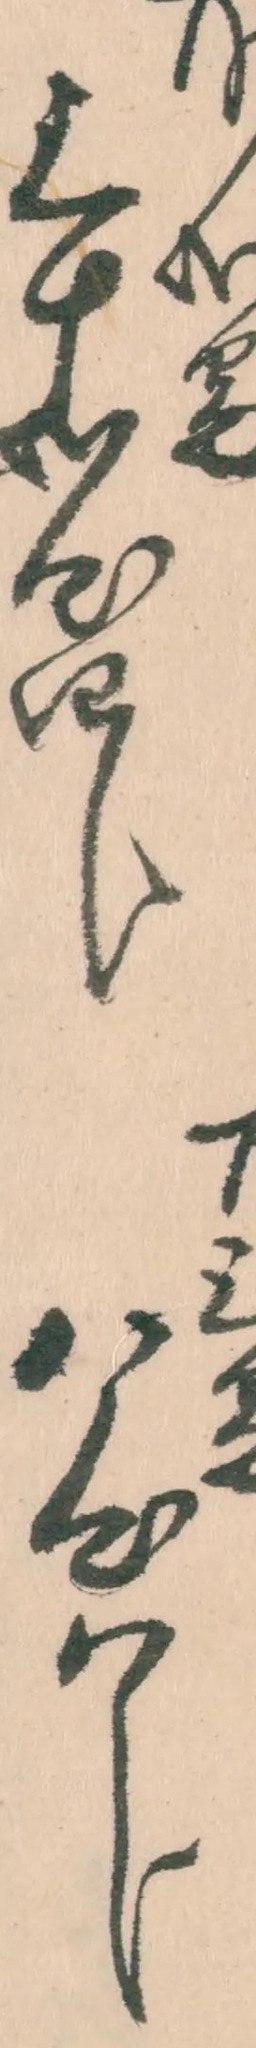三十弐匁四分八匁八分
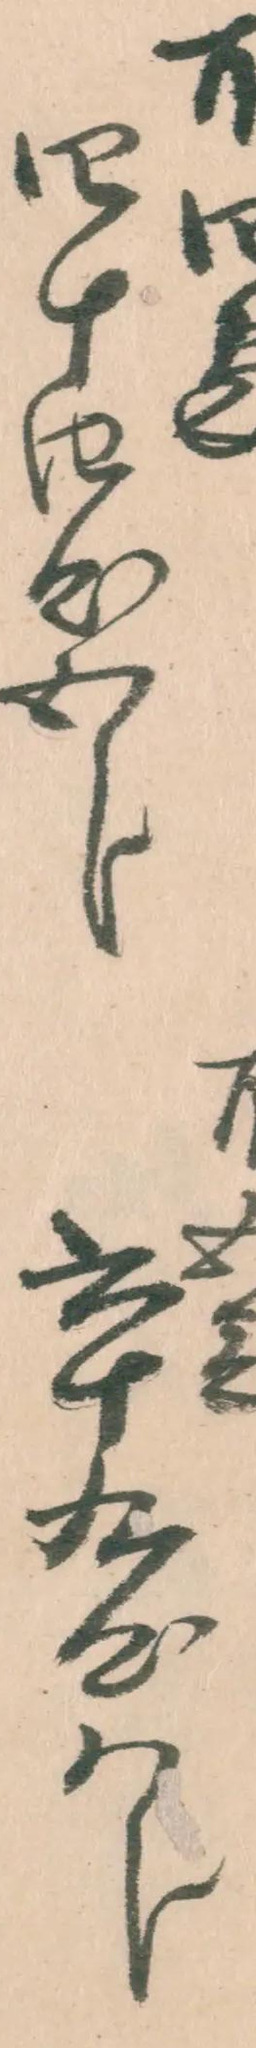四十四匁五分六十九匁八分
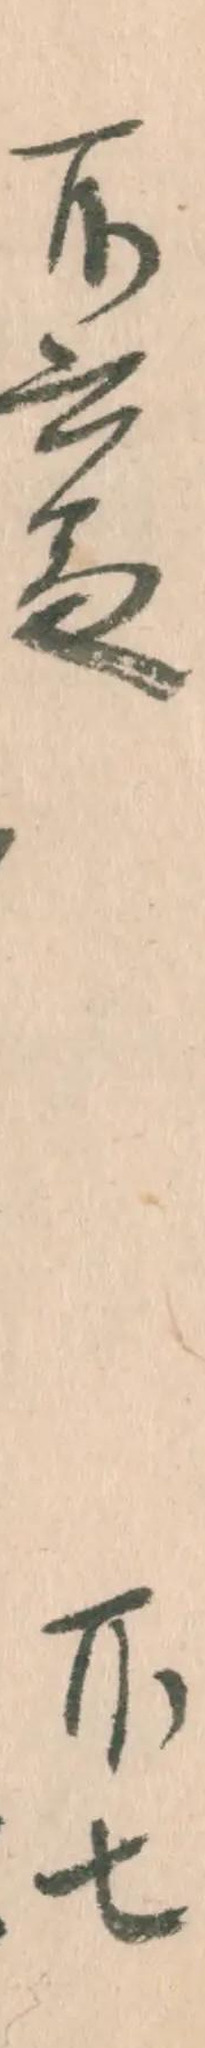廿六両廿七
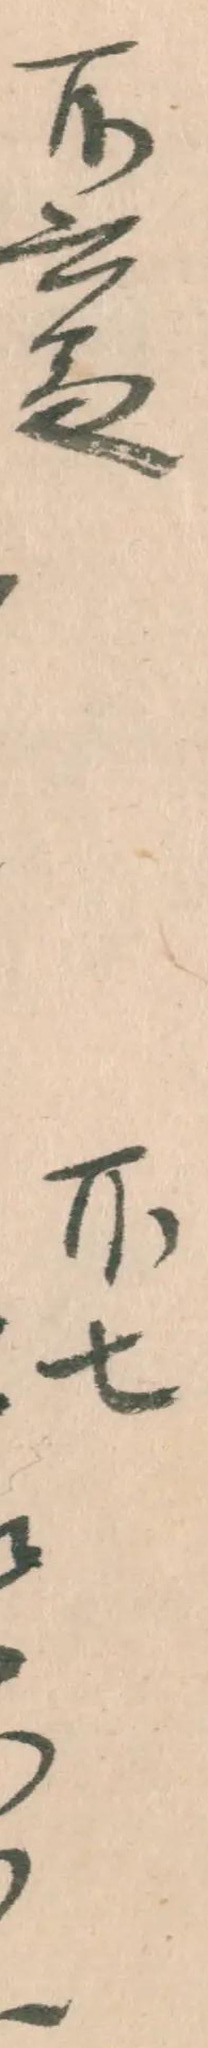廿六両廿七
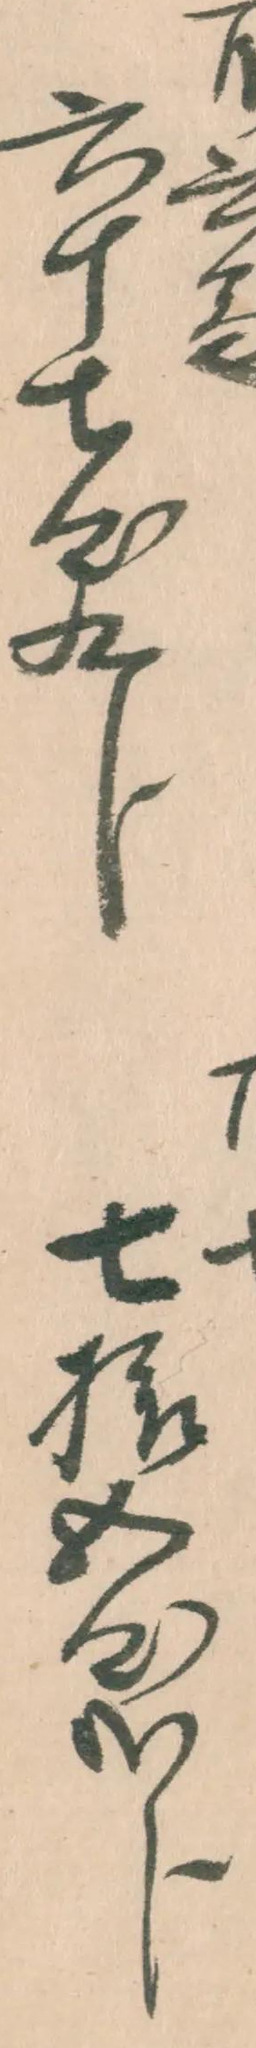六十七匁九分七十五匁弐分

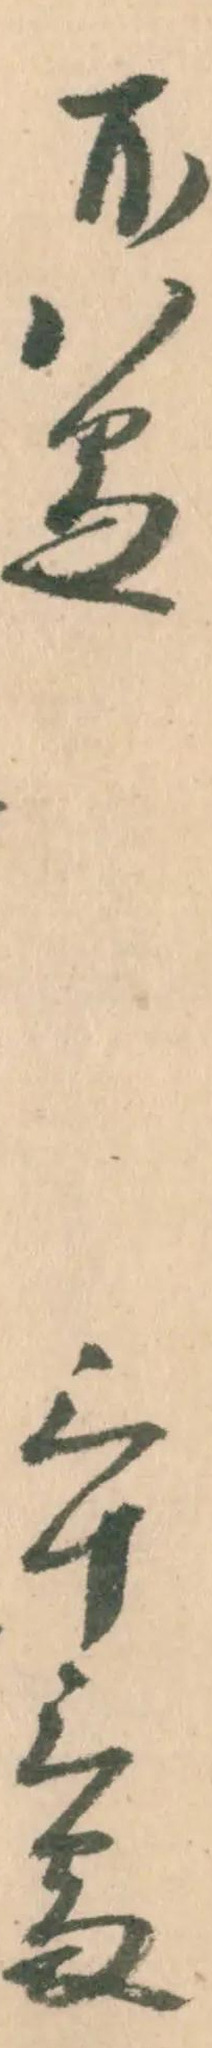廿八両三十三両
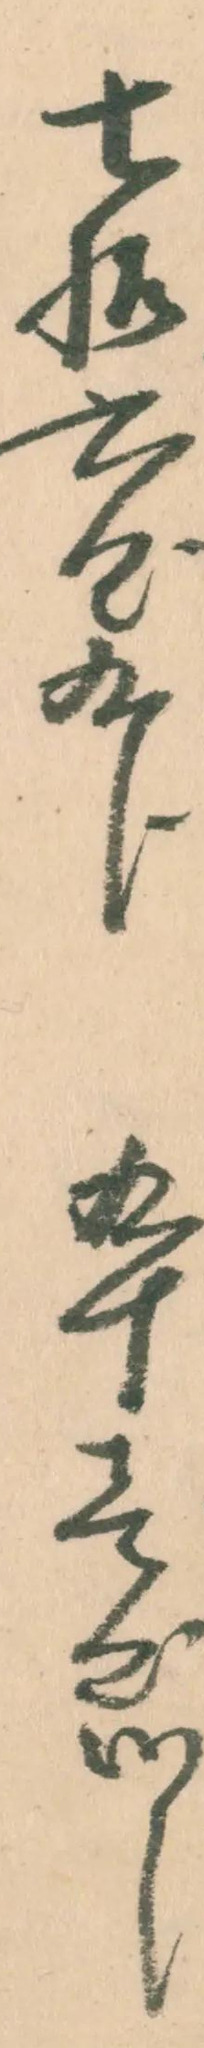七拾六匁九分五十壱匁弐分
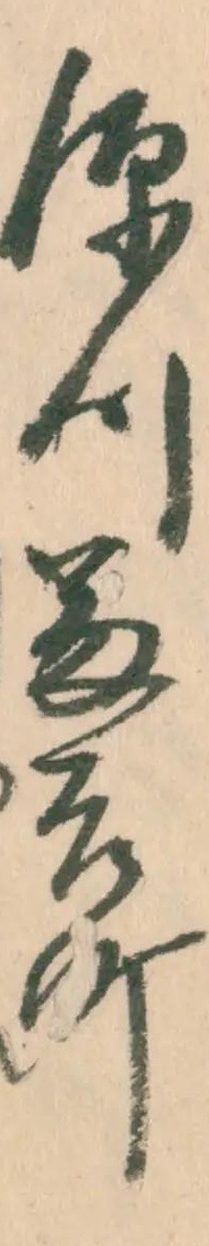深川富吉町
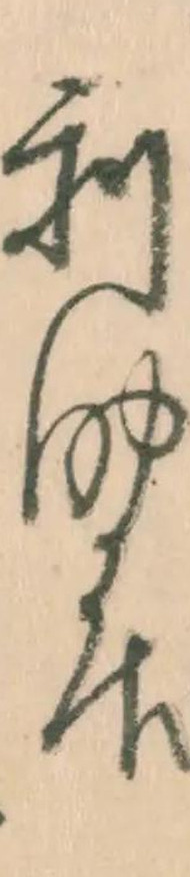利助店
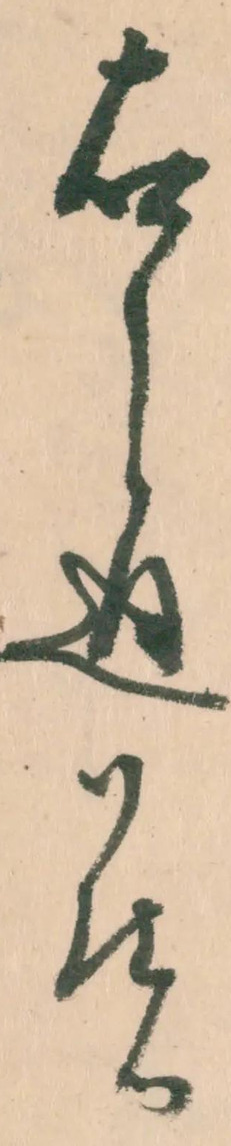右之通御座候
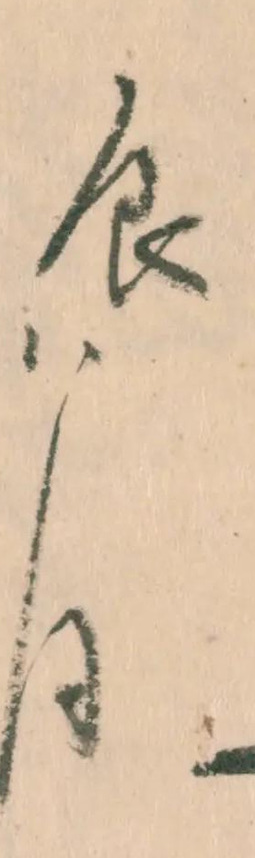辰八月
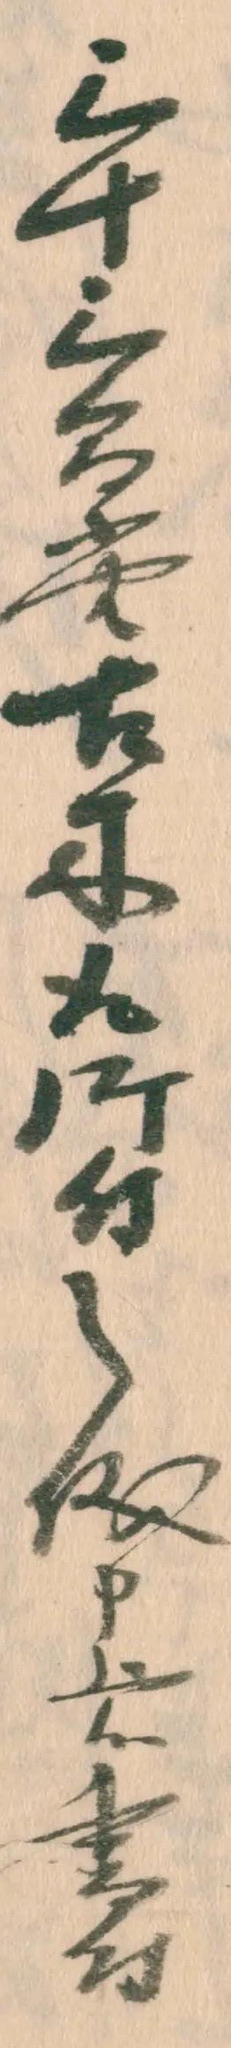│三十三間堂古木取片付之儀申上候書付
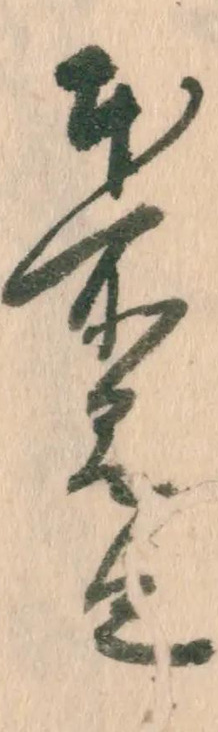│本所見廻
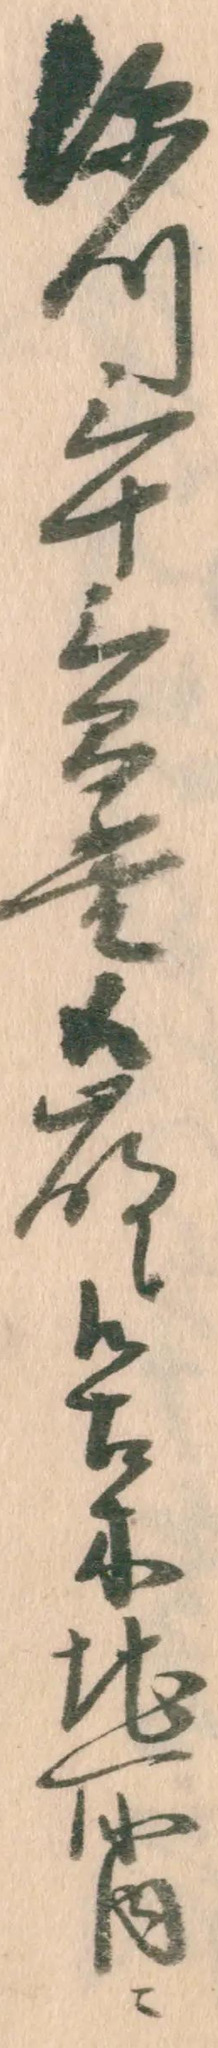深川三十三間堂取崩し候古木地所内ニ
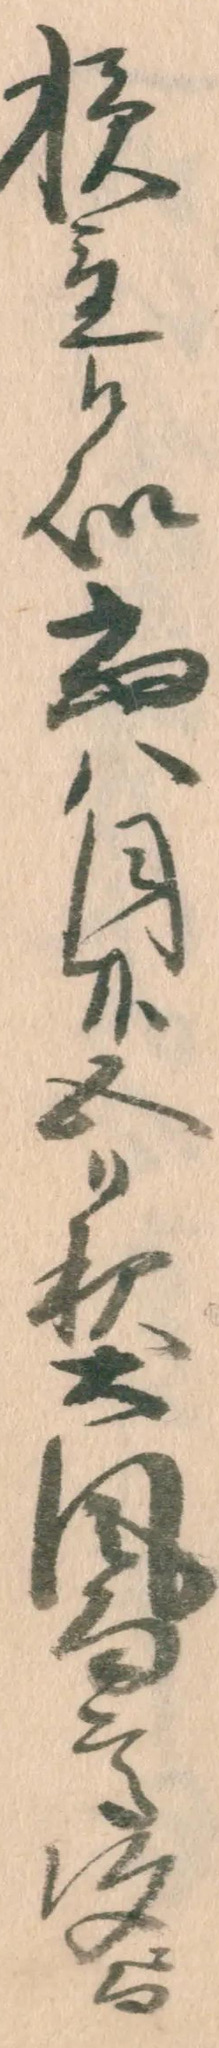積置候処当八月廿五日夜大風雨高汐ニて
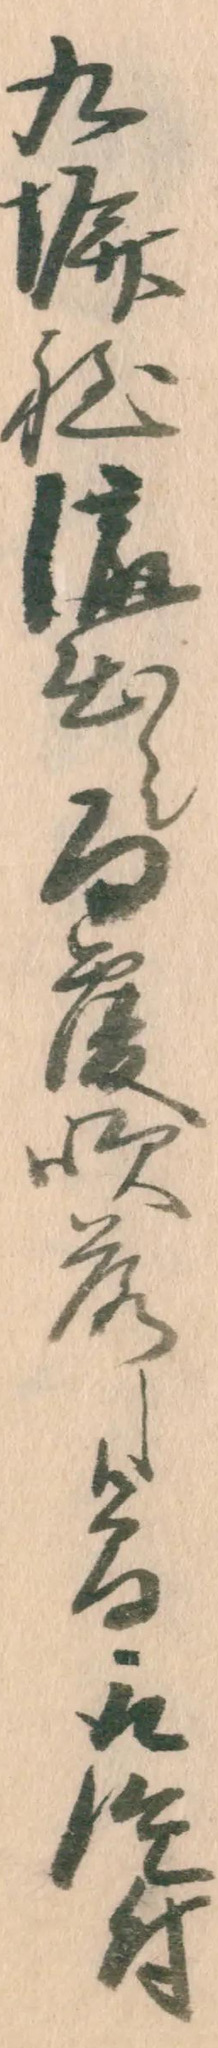九塀程流出シ雨覆吹落し候間取片付
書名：三十三間堂. [2]
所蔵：国立国会図書館 National Diet Library, JAPAN
